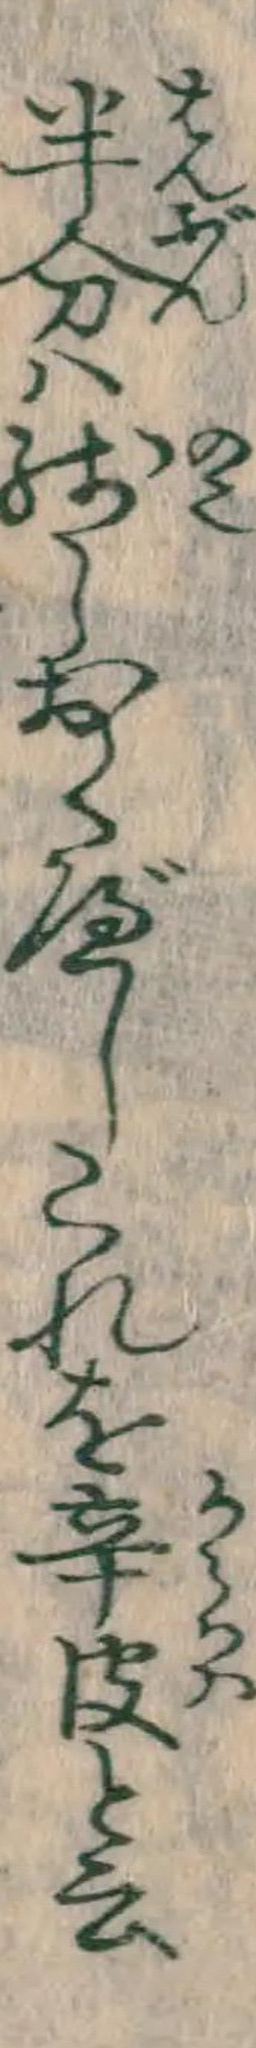半分は残しおくべしこれを辛皮と云
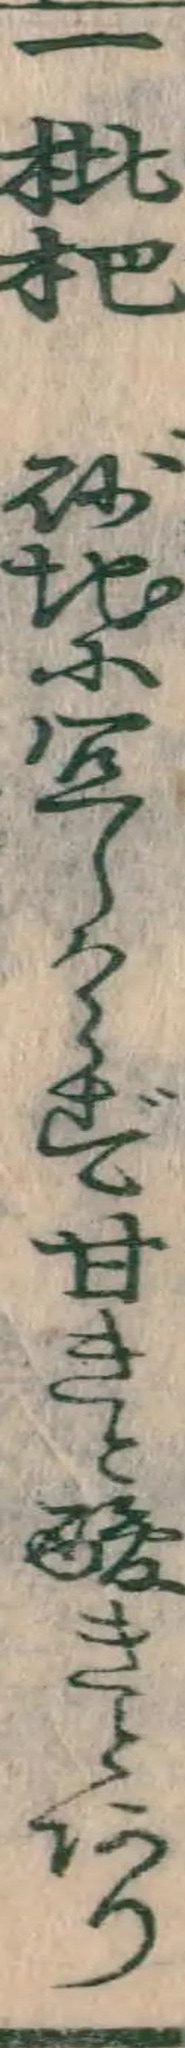一枇杷砂地に宜しからず甘きと酸きとあり
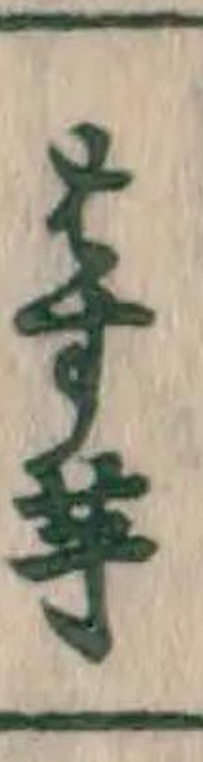はす芋
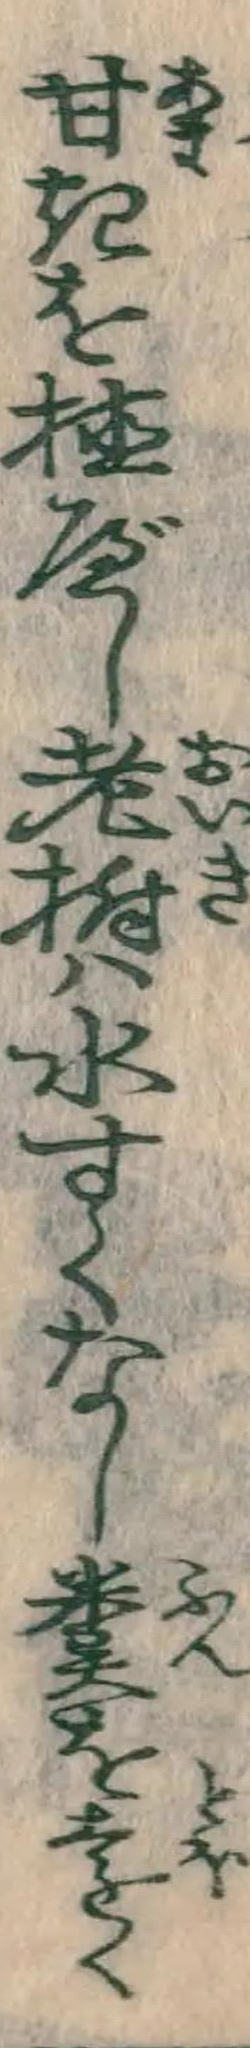甘きを植べし老樹は水すくなし糞を遠く
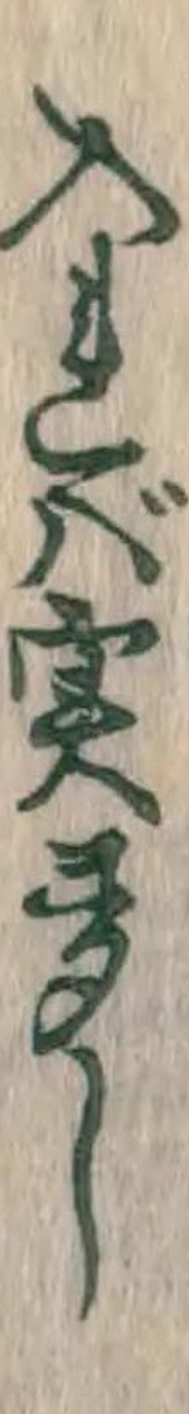入れば実多し
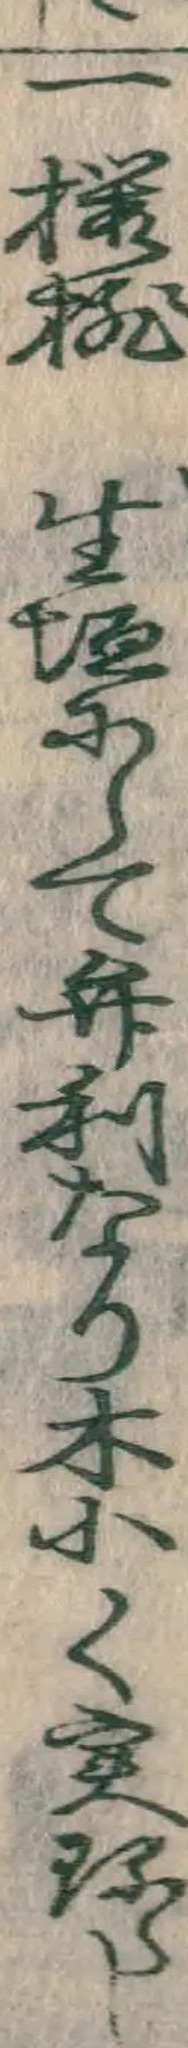一桜桃生垣にして弁利なり木小く実珍らし
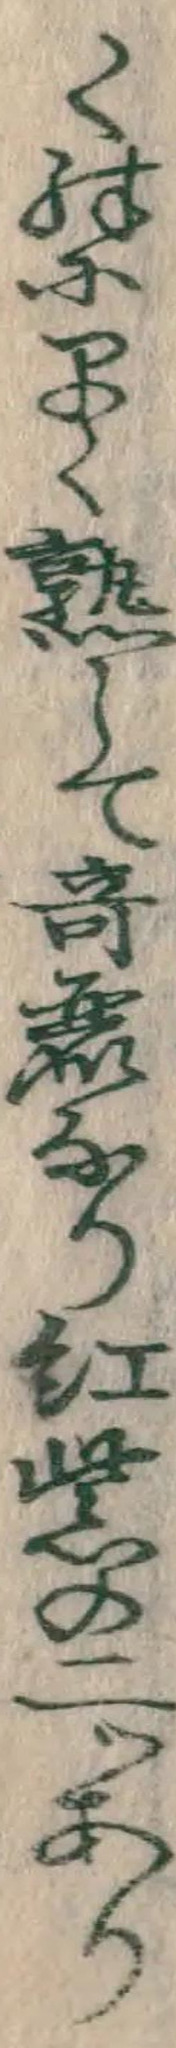く殊に早く熟して奇麗なり紅紫の二ッあり
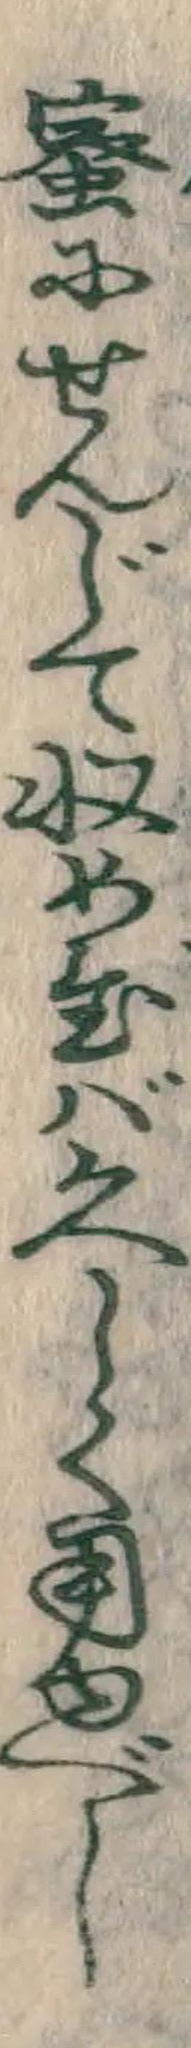蜜にせんじて収め置ば久しく用ゆべし
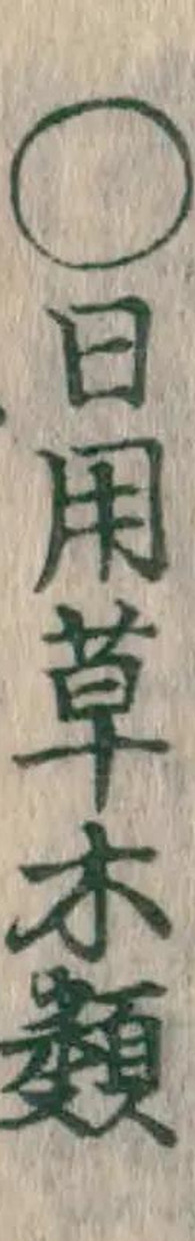○日用草木類
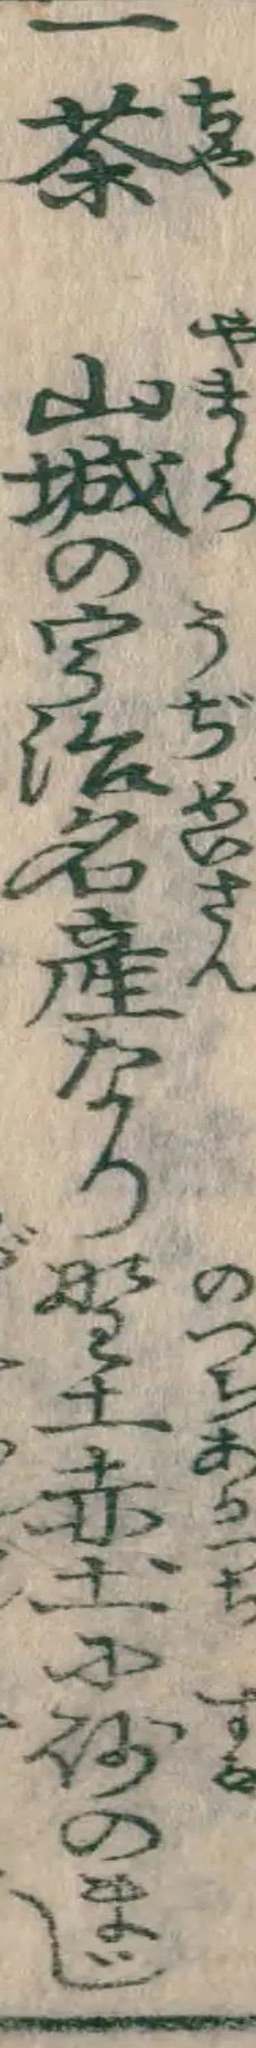一茶山城の宇治名産なり野土赤土に砂のまじ
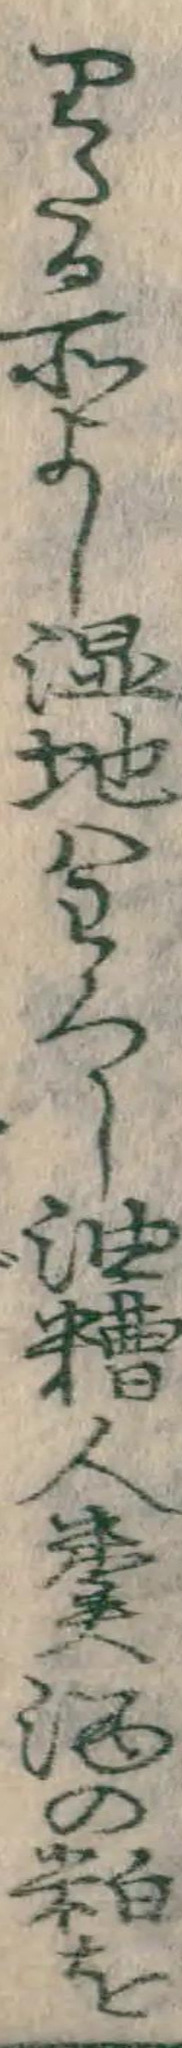りたる所よし湿地はわろし油糟人糞酒の粕を
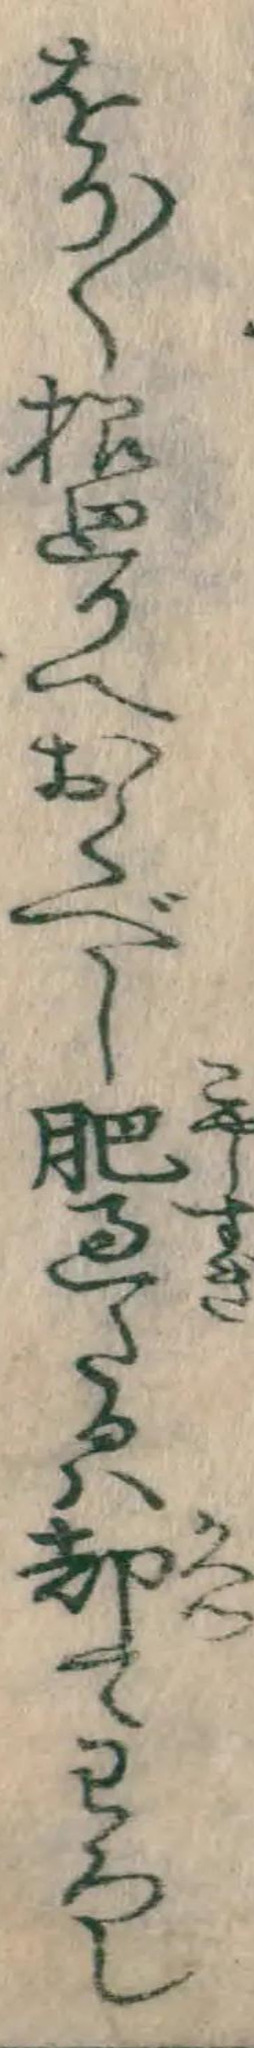をり〳〵根廻りへおくべし肥過たるは却てわろし
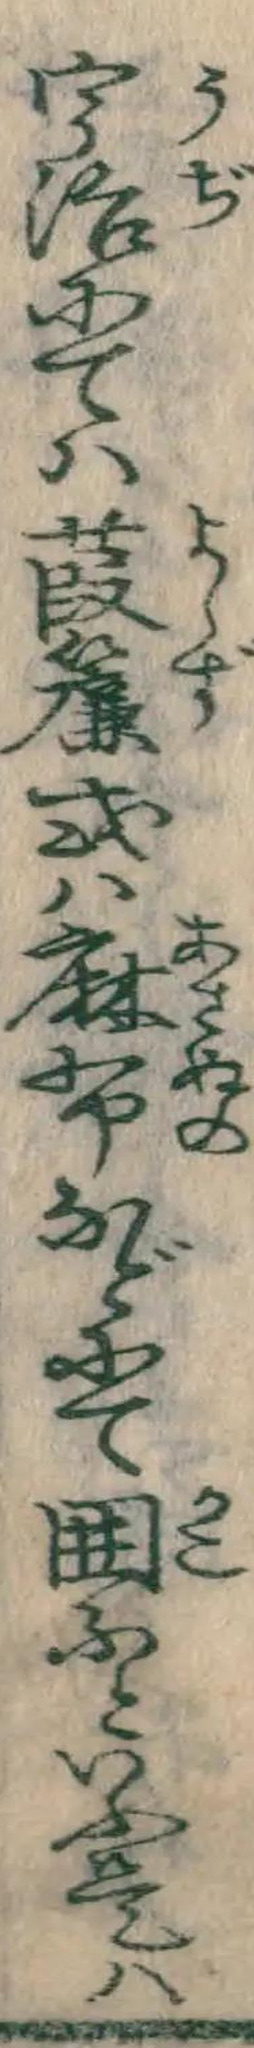宇治にては葭簾或は麻布などにて囲ふといふ是は
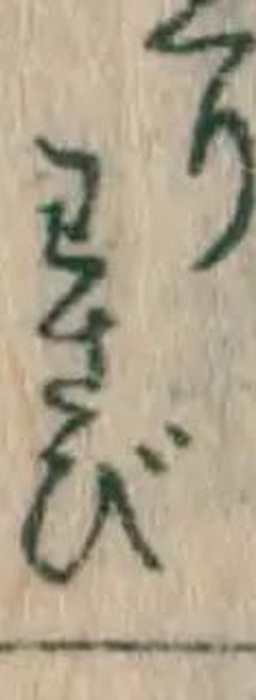わさび
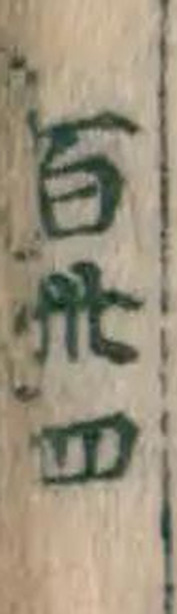百卅四

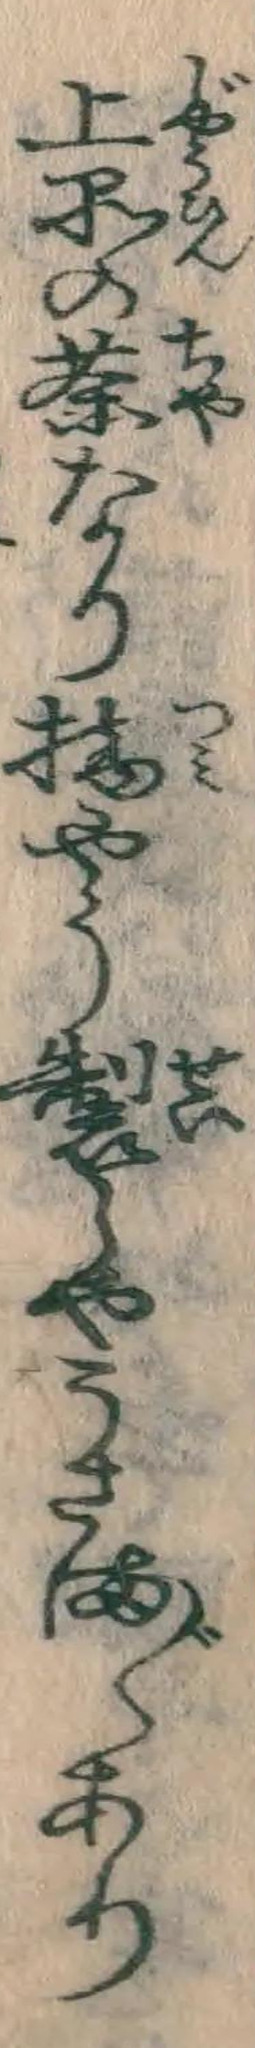上品の茶なり摘やう製しやうさま〴〵あり
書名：広益秘事大全 3巻. [5]
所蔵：国立国会図書館 National Diet Library, JAPAN
